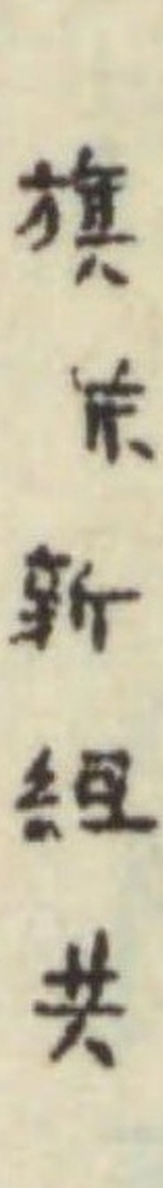旗并新組共
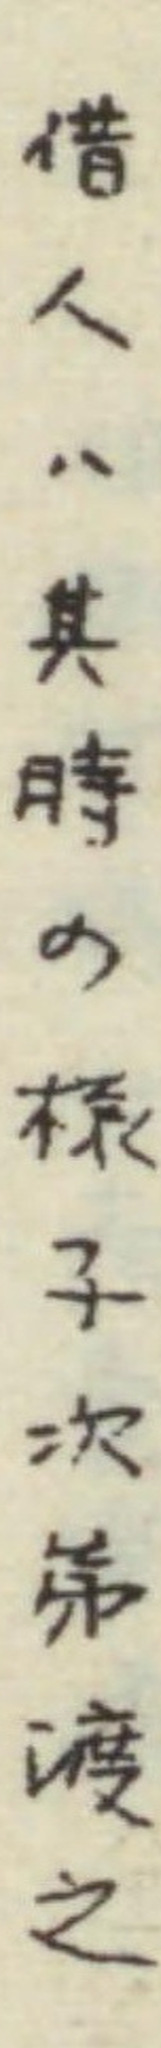借人ハ其時の様子次第渡之
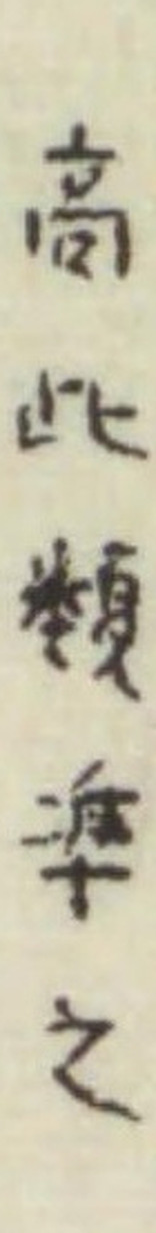高此類準之
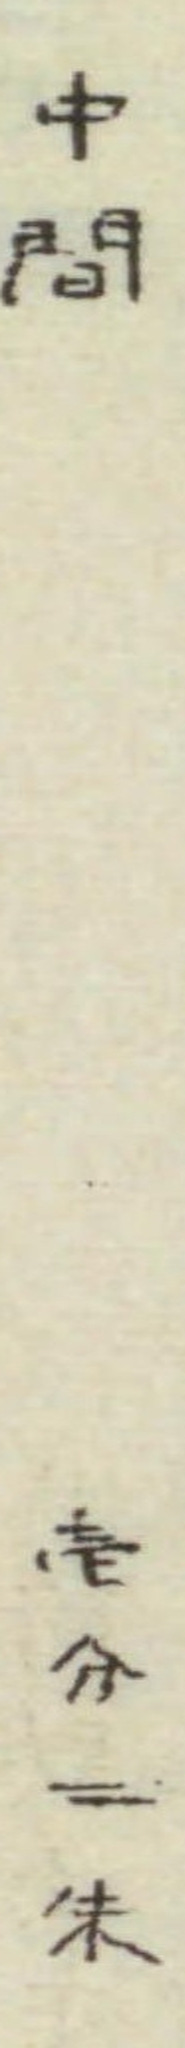中間壱分二朱
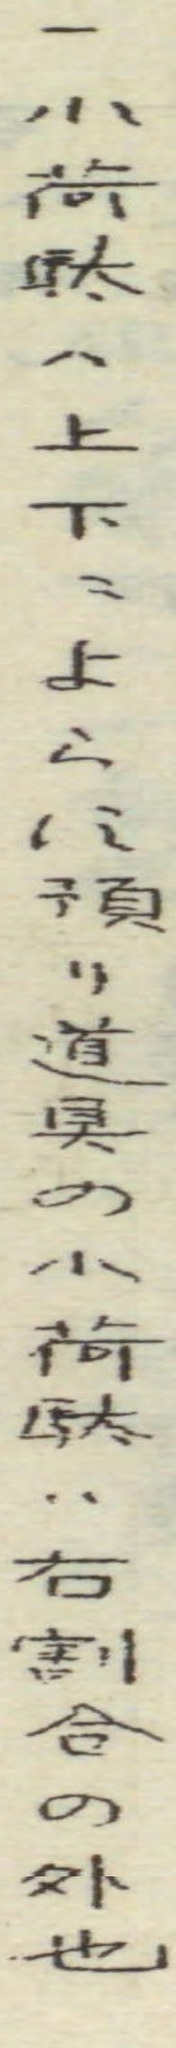一小荷駄ハ上下二よらす預り道具の小荷駄ハ右割合の外也
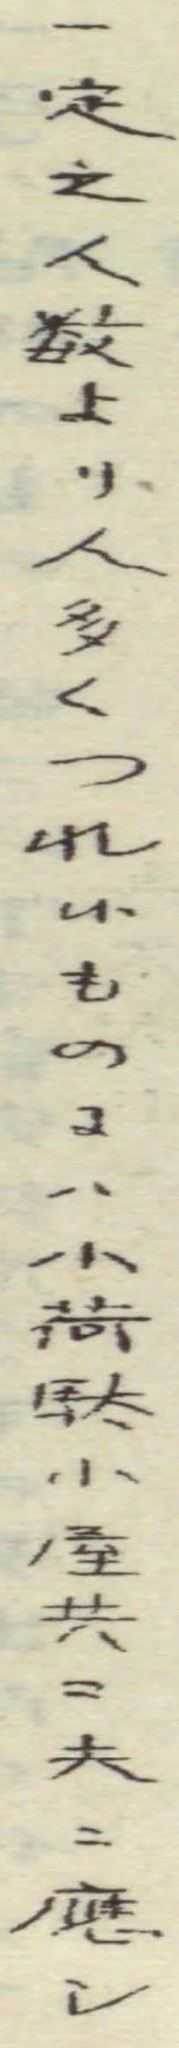一定之人数より人多くつれ候ものにハ小荷駄小屋共二夫二応シ
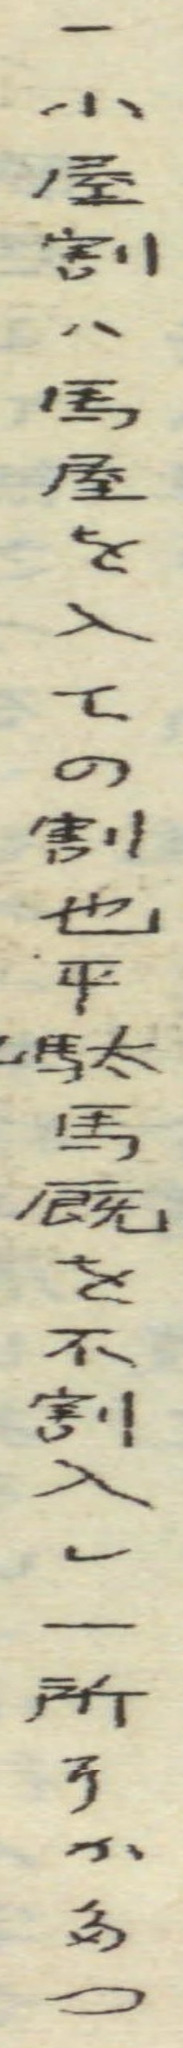一小屋割ハ馬屋を入ての割也平駄馬厩を不割入レ一所からつ
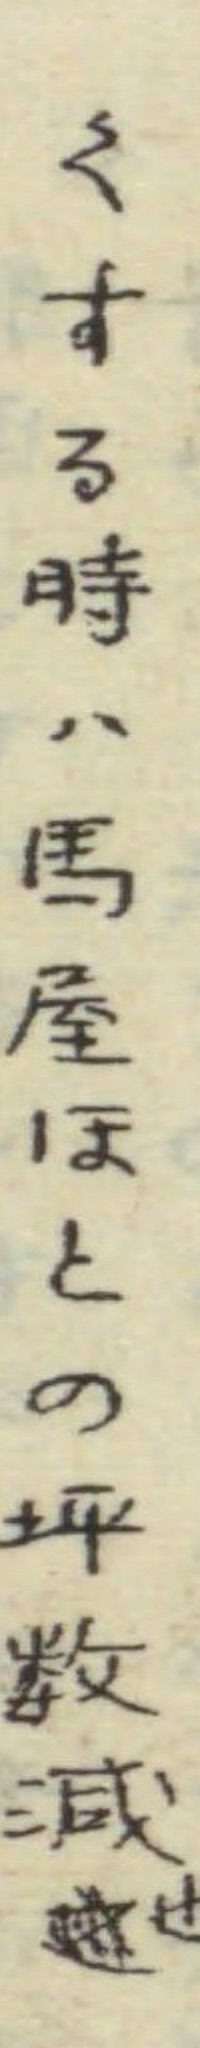てする時ハ馬屋ほとの坪数減也
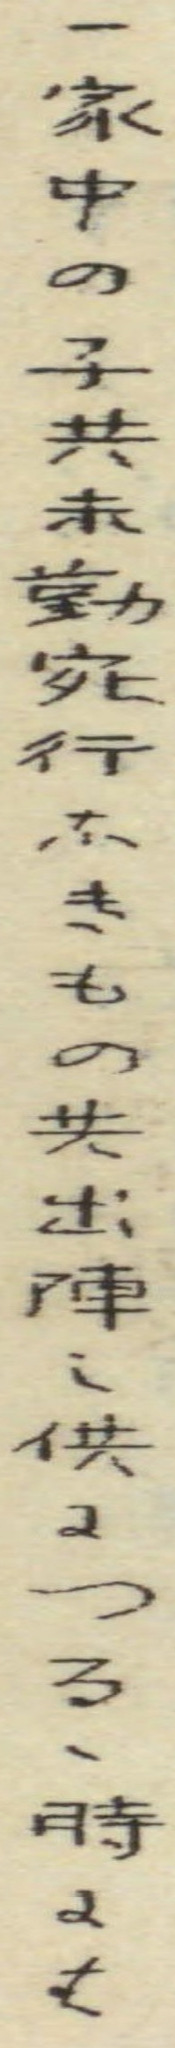一家中の子供未勤宛行なきもの共出陣之供につるゝ時には

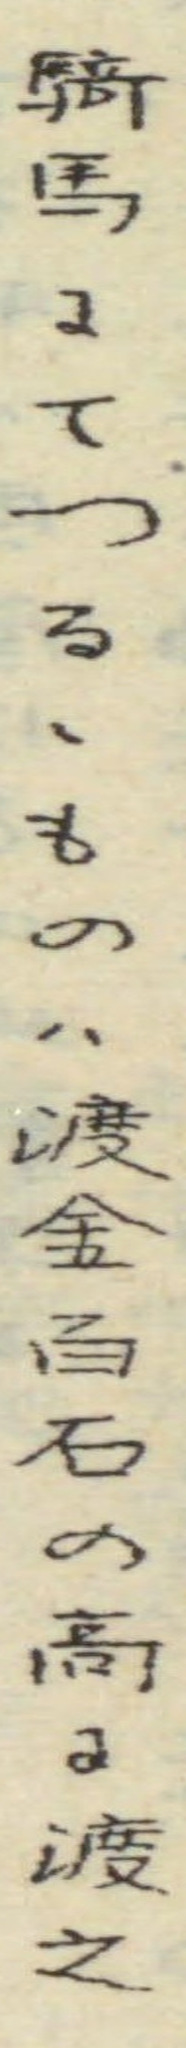騎馬にてつるゝものハ渡勤百石の高に渡之
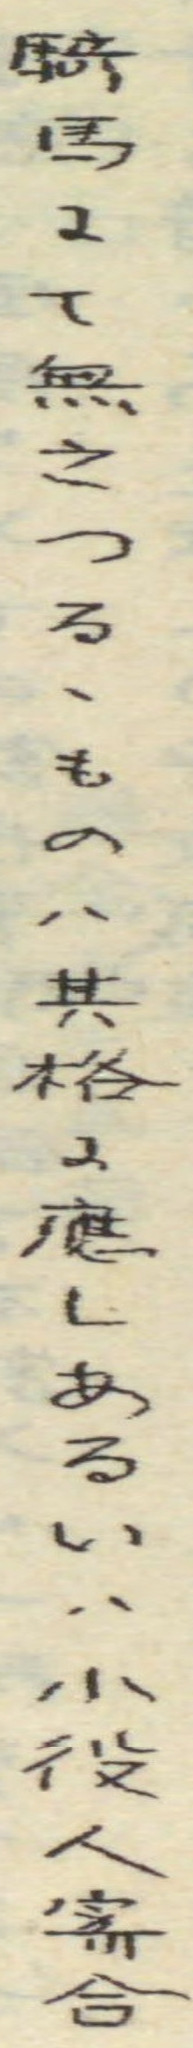騎馬にて無之つるゝものハ其格に応じあるいハ小役人寄合
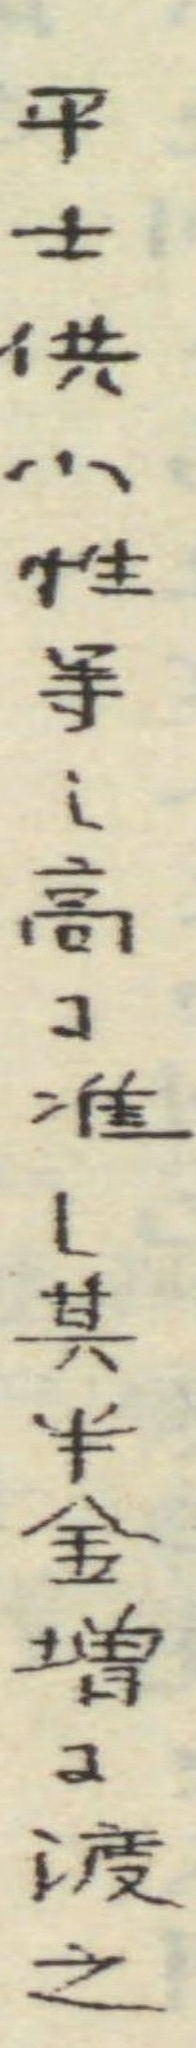平士供小姓等の高に準し其半金増に渡之
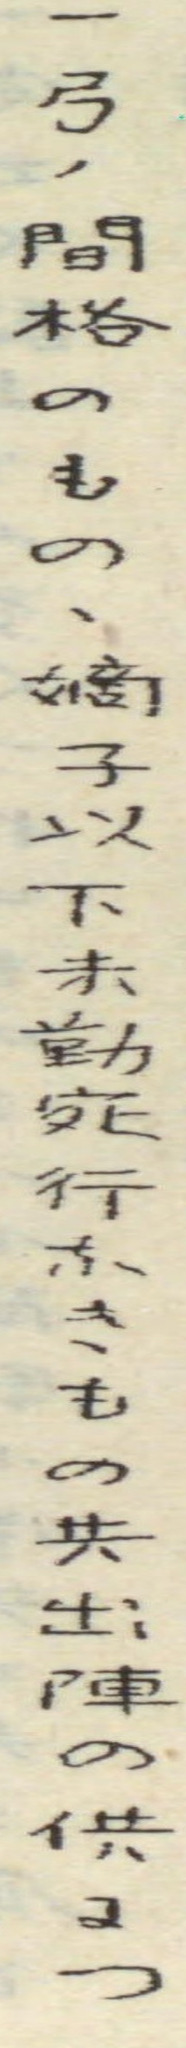一弓ノ間格のものゝ嫡子以下未勤宛行なきもの共出陣の供につ
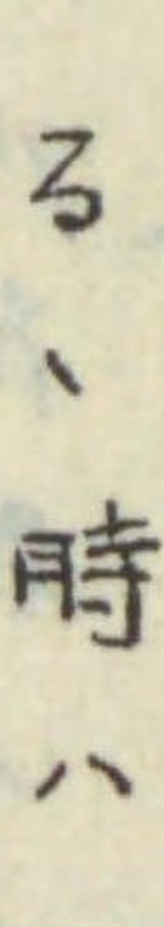るゝ時ハ
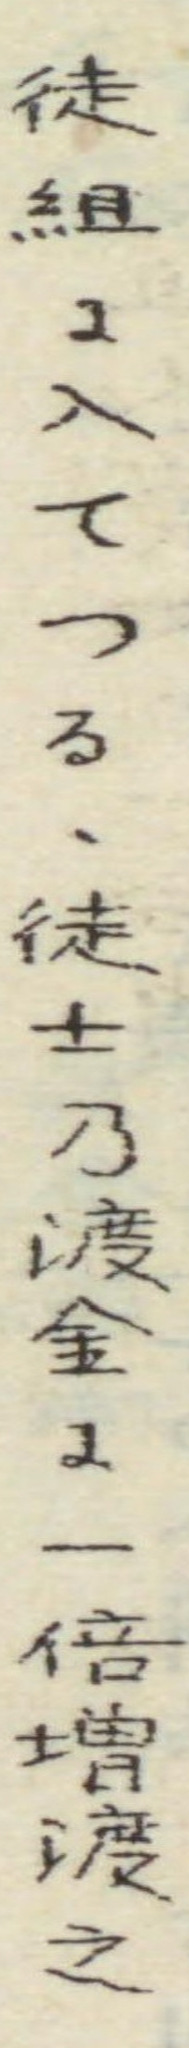徒組に入てつるゝ徒士の渡勤に一倍増渡之
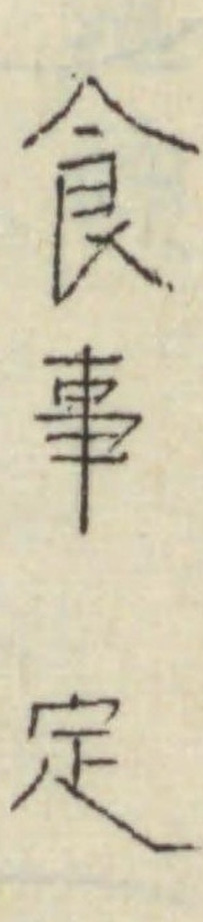食事定
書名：三河吉田藩動員史料
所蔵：国立国会図書館 National Diet Library, JAPAN
